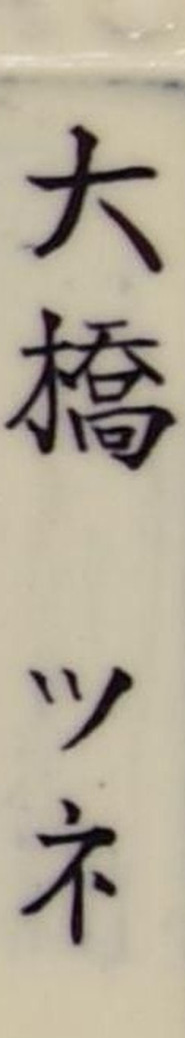大橋ツネ
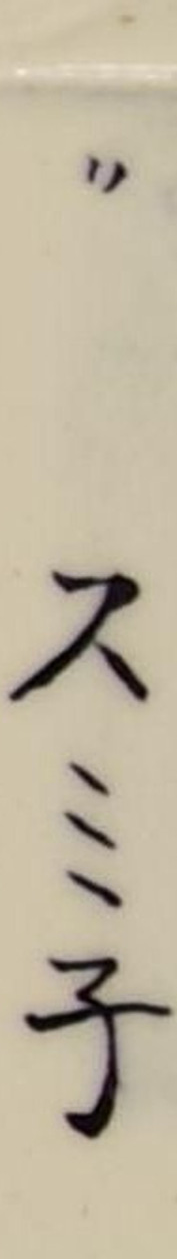スミ子
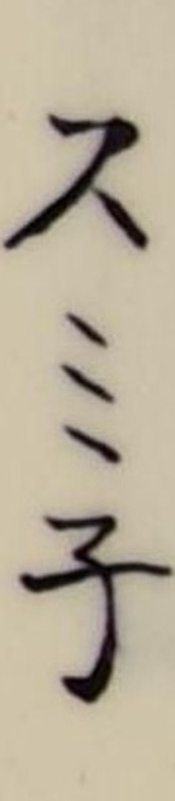スミ子
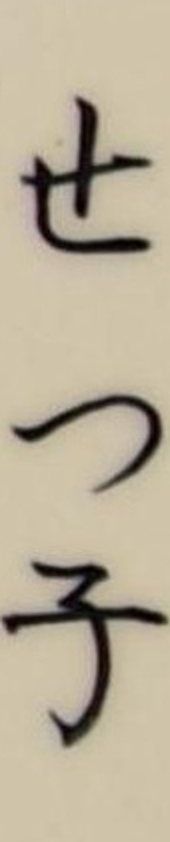せつ子
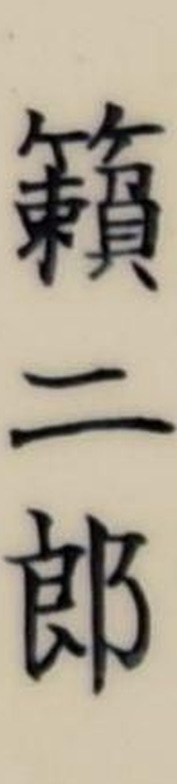籟二郎
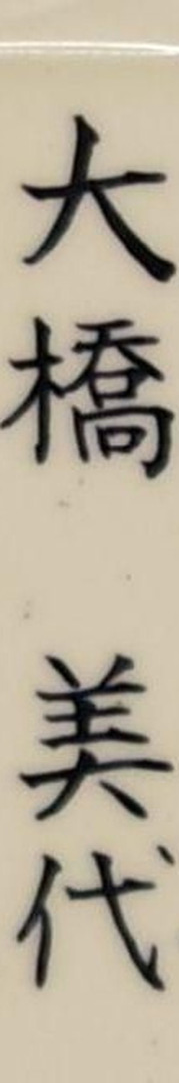大橋美代
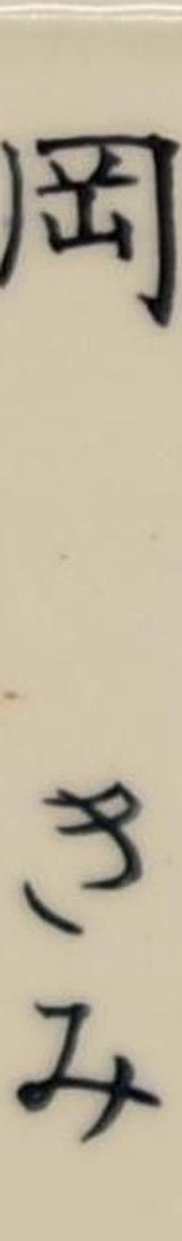岡きみ
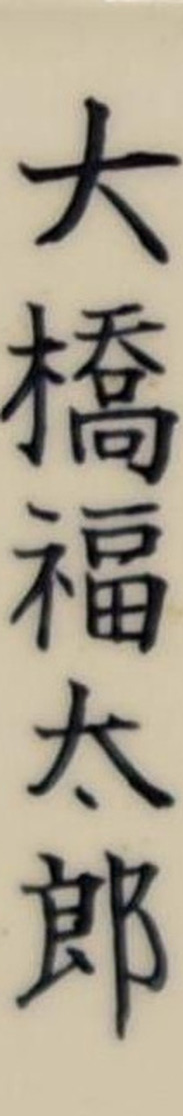大橋福太郎
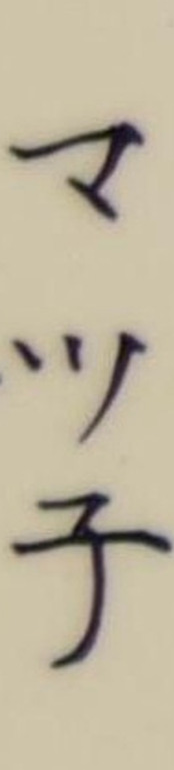マツ子

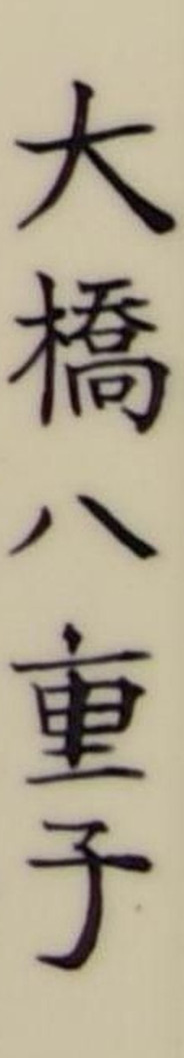大橋八重子
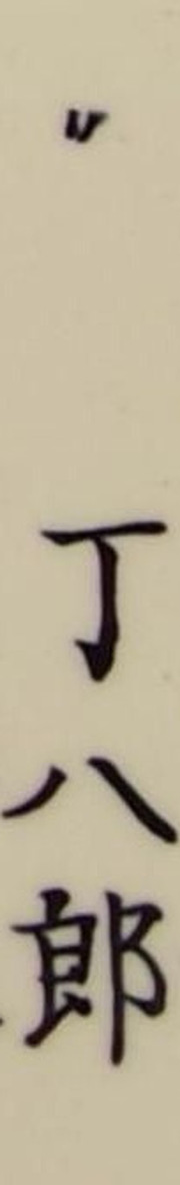丁八郎
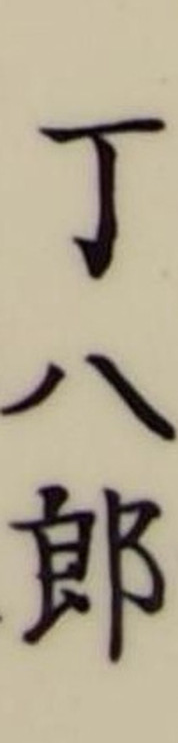丁八郎
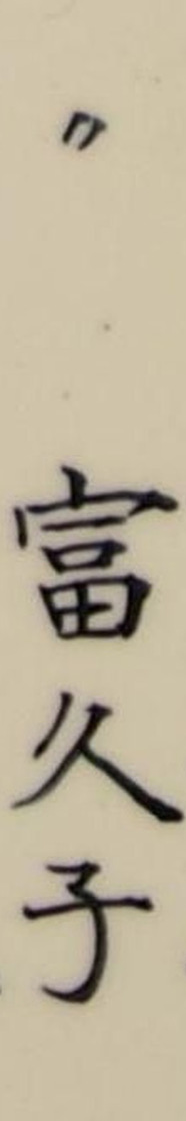富久子
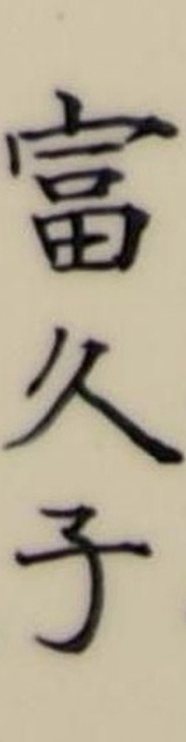富久子
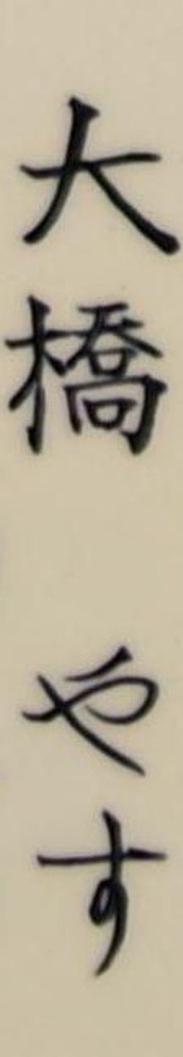大橋やす
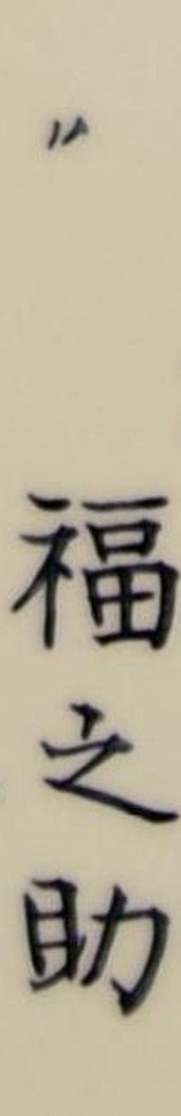福之助
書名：A~D
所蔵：koyasan kongobuji
